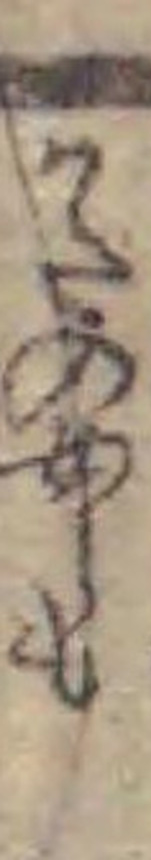かたの女郎も
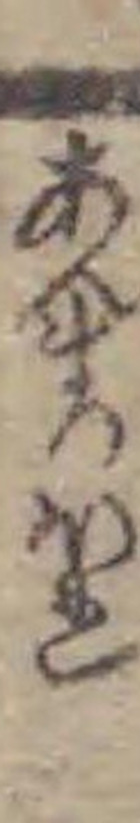あんまりほれ
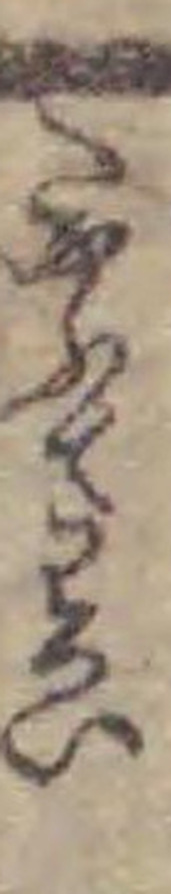たやふてはない
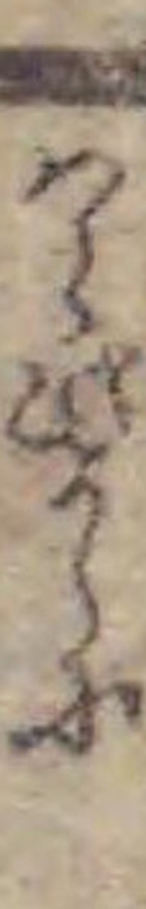から此ように
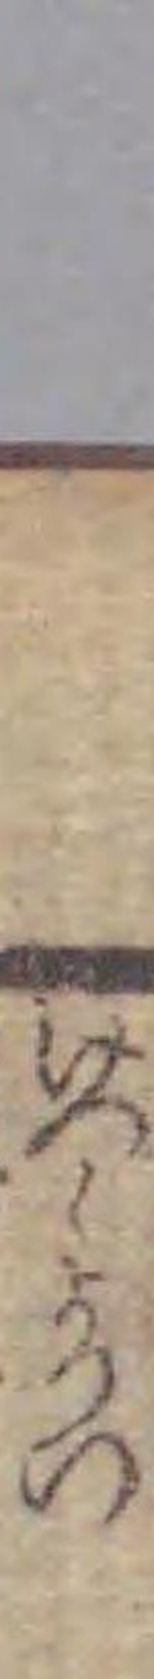けつしよりは
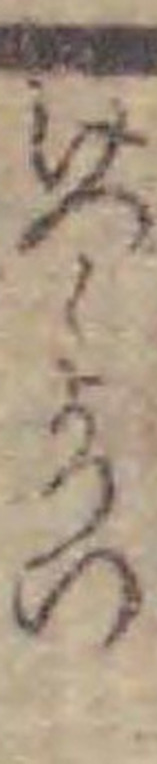けつしよりは
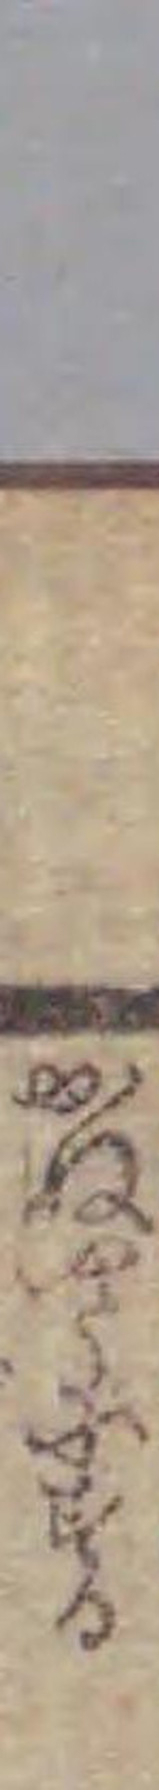かねやうにする
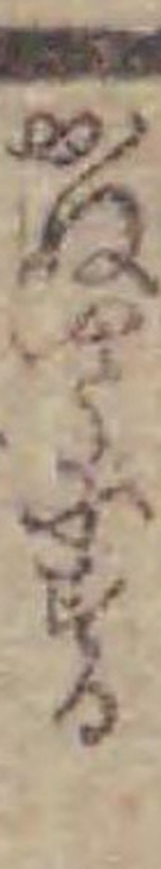かねやうにする
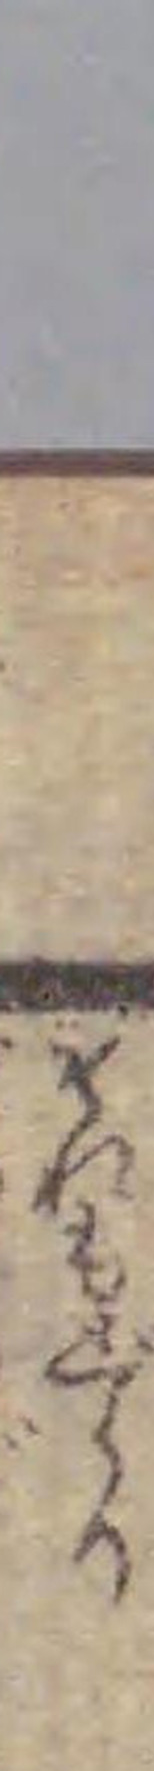それもどうり
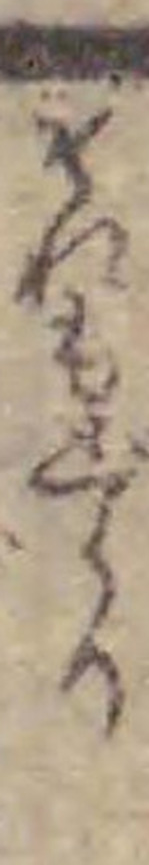それもどうり
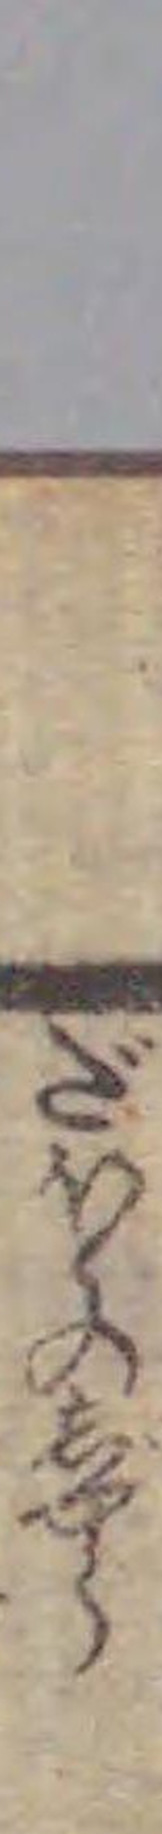だほかのじやう
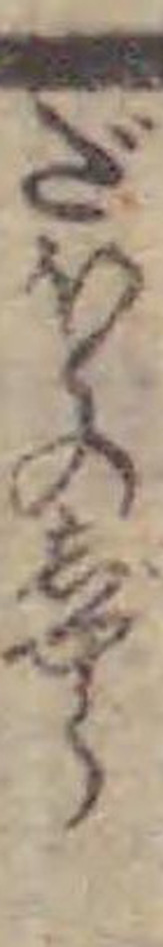だほかのじやう
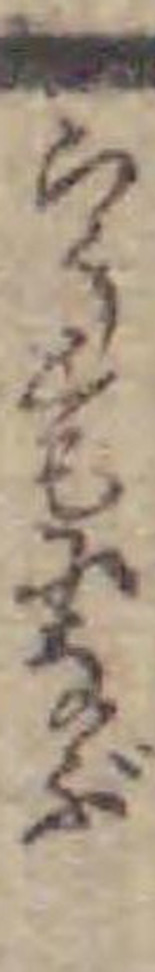らうともになぶ
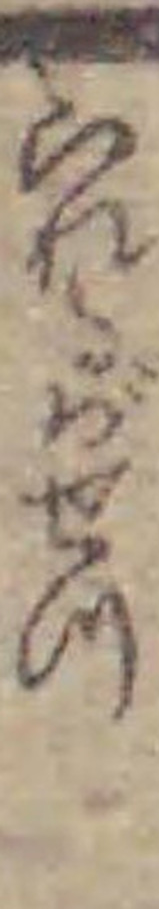られるがせつ
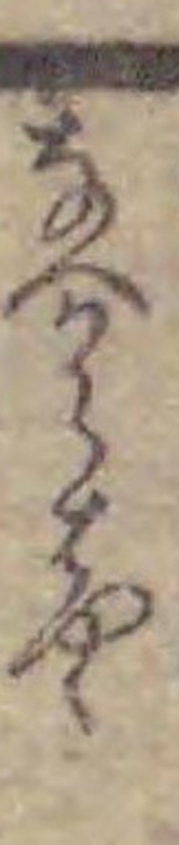なへからはやく
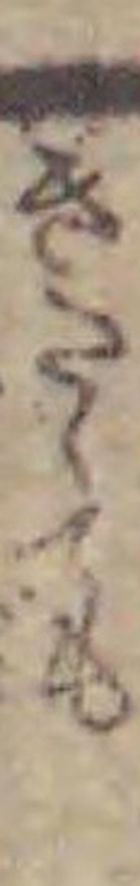きたくても
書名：通風伊勢物語 : 3巻
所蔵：国立国会図書館 National Diet Library, JAPAN
